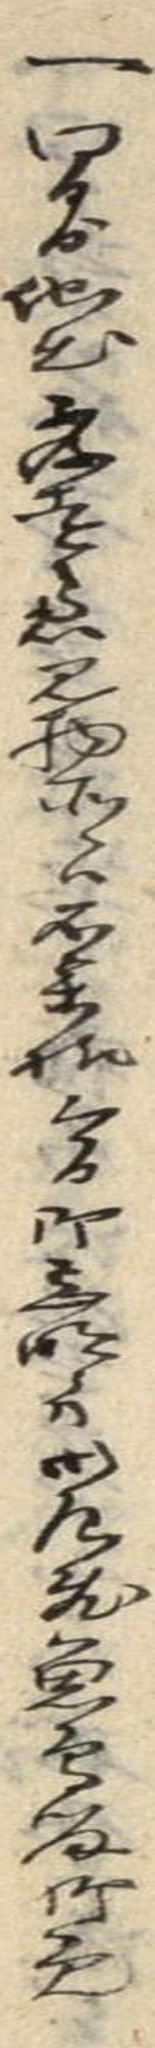一同日ゟ他出不及遠慮見物所へは不参様今日御忌明に付御屋敷魚鳥留御免
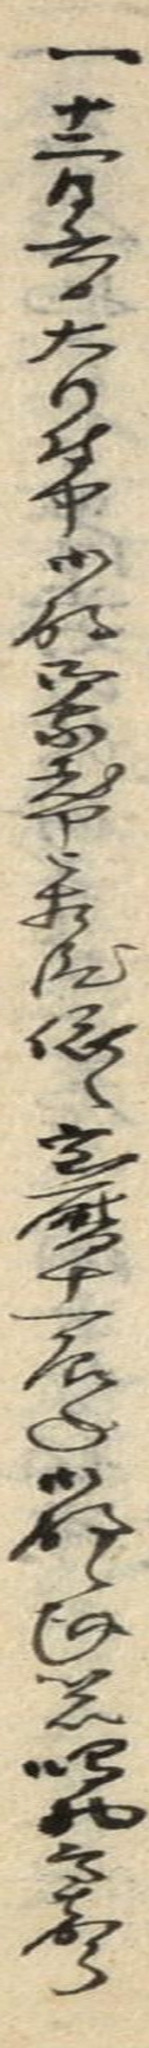一十二月六日大目付中御触御家老中被相渡依之宝暦十一辰年御触之趣を以鳴物高声
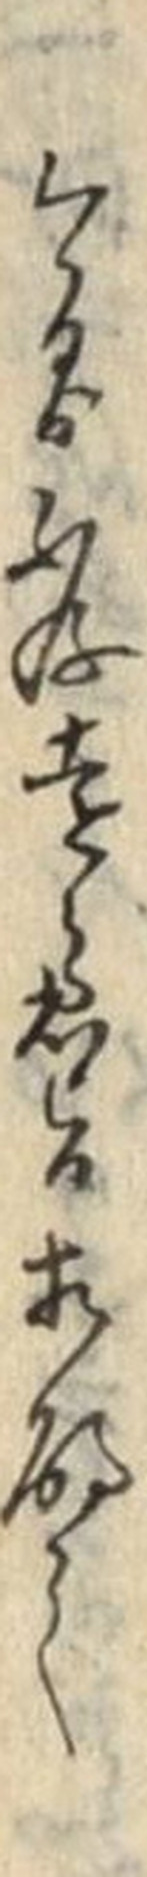今日ゟ不及遠慮旨相触之
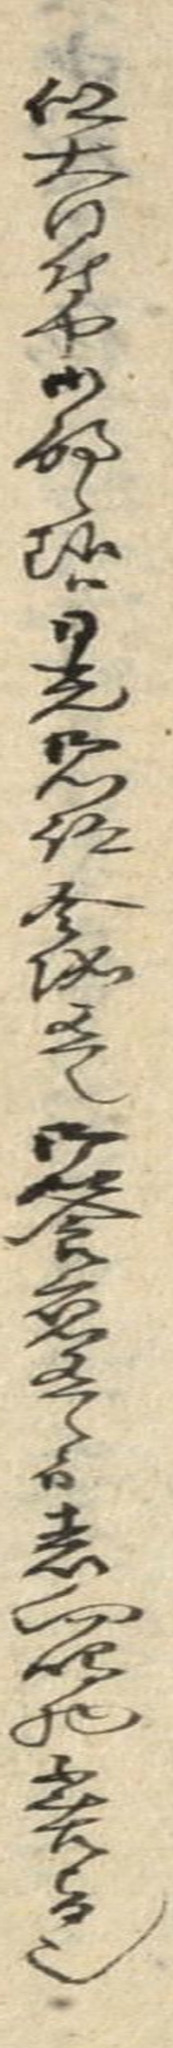但大目付中御触之趣は日光御門跡登城有之饗応有之に付表向鳴物不苦旨也
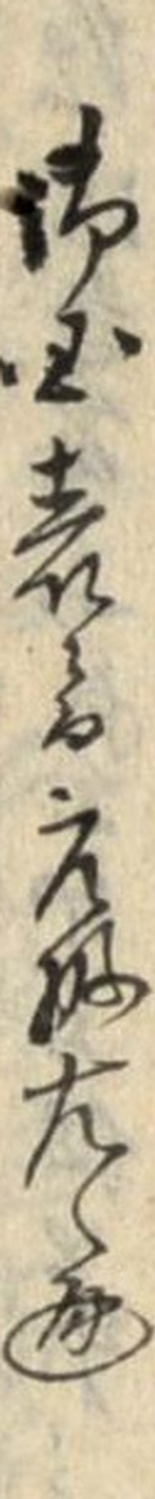御国表にて取扱左之通

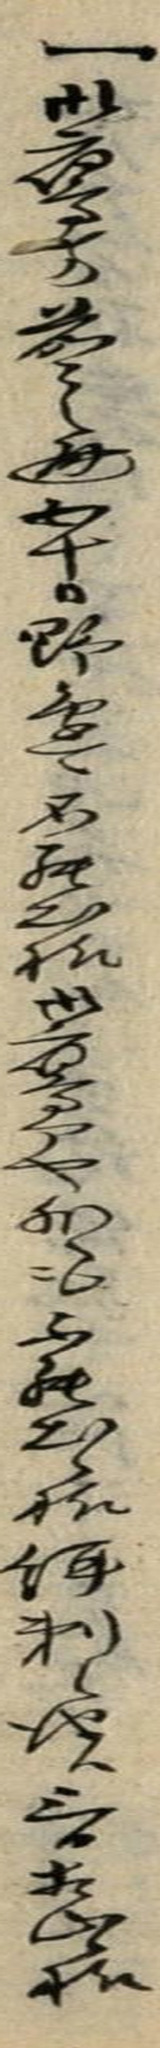一御鷹方前々之通五十日野辺へ不罷出様御鷹部や外へも不罷出候様餌刺之儀は三日相止候様
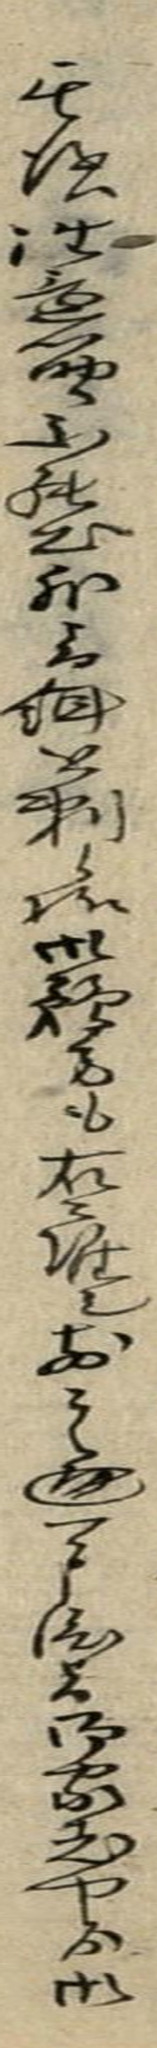其後は往還筋へ不罷出外にて餌を刺候様御鵜方も右に准シ前々之通可申渡旨御家老中ゟ御
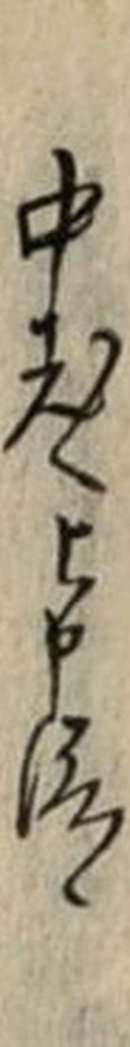中老へ被申渡候
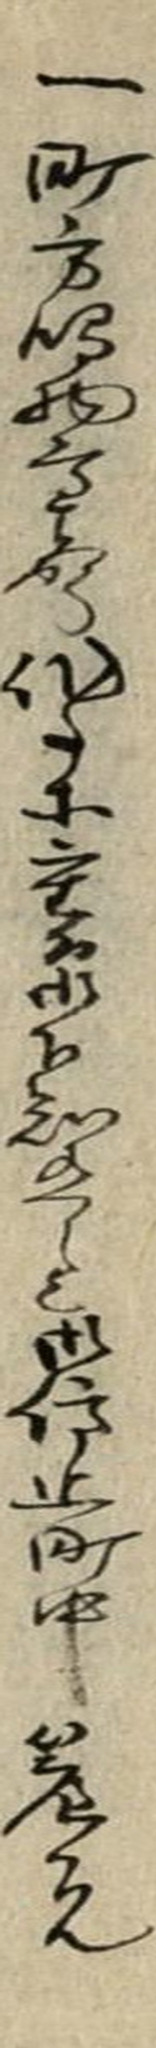一町方鳴物高声作事等重て御下知有之迄御停止町中簾下ル
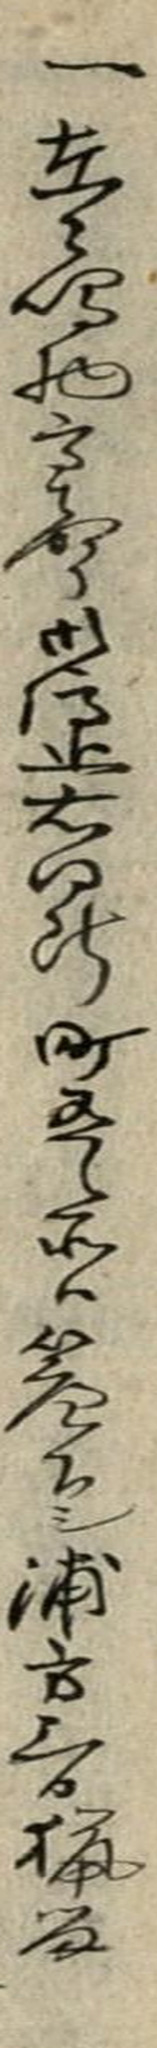一在々鳴物高声御停止右同断町有之所は簾下シ浦方三日猟留
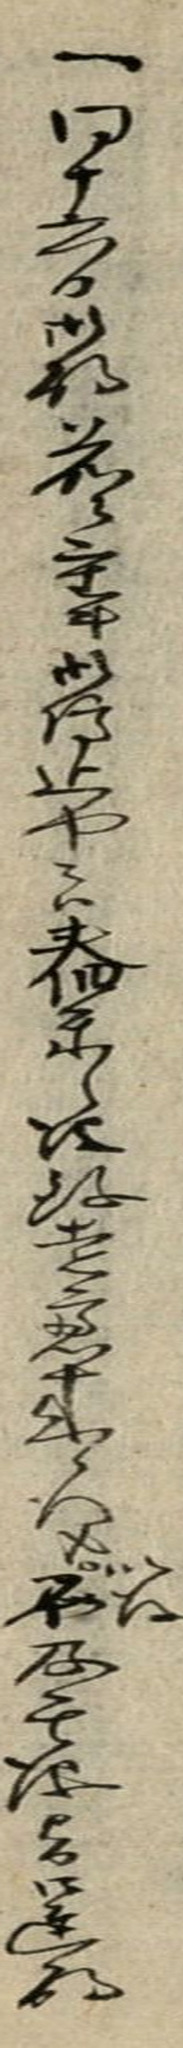一同十六日御触前々重キ御停止中には舂米之儀致遠慮来候得共◦以後不及其儀旨口達触
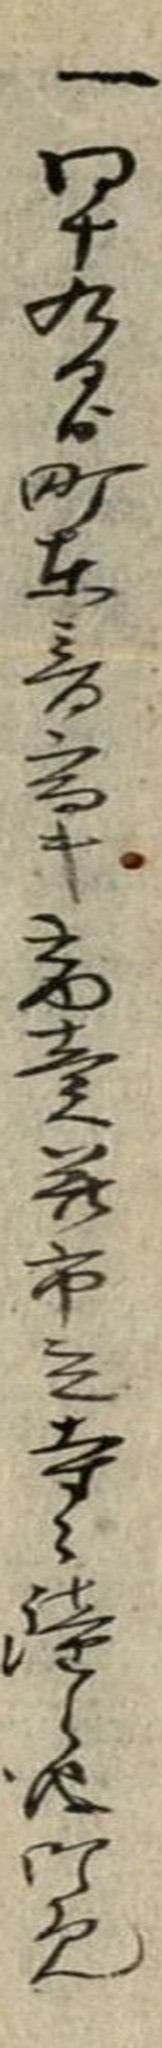一同十九日ゟ町在音高キ商売并市立寺々鐘之儀御免
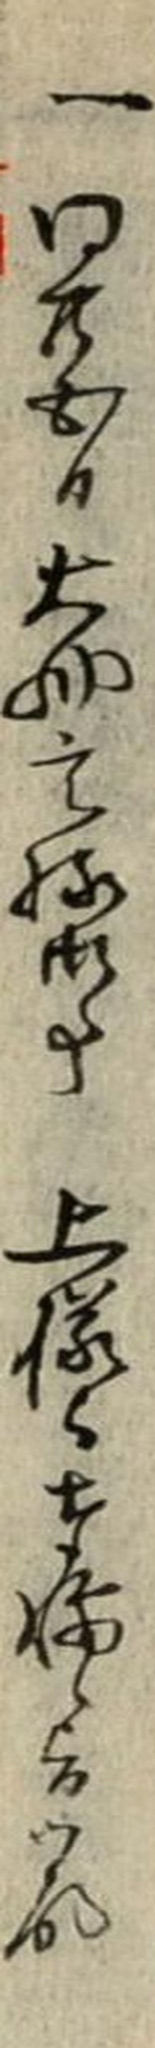一同廿五日大納言様御事上様と奉称候旨御触
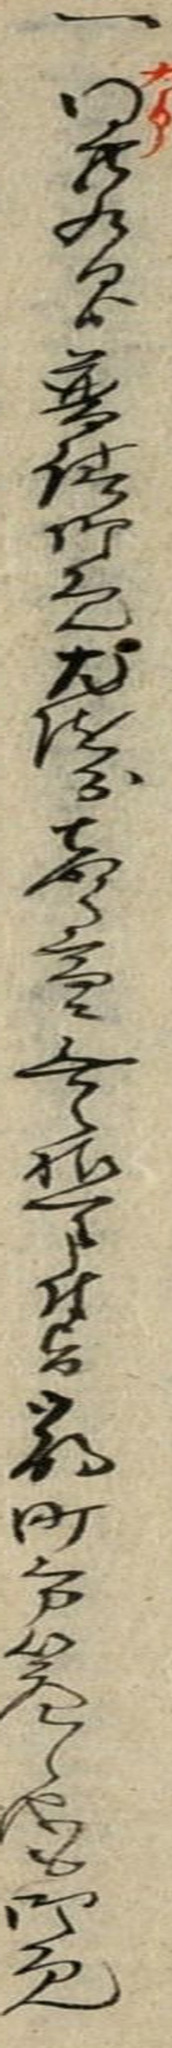前一同廿九日ゟ普請御免尤随分声高に無之様可申付旨御触町方簾之儀も御免
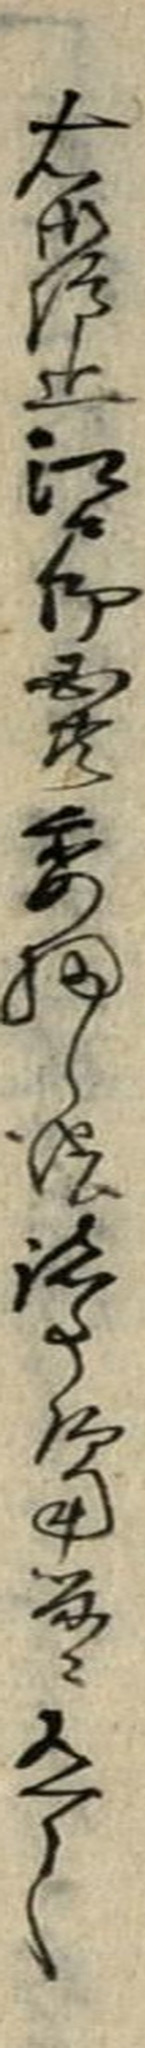右御停止江戸御国共委細之儀は諸事御用留に有之
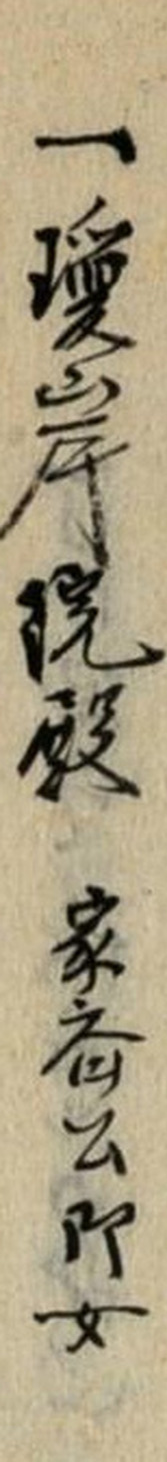一瓊岸院殿家斉公御女
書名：御停止異変死失
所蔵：福井県文書館 Fukui Prefectural Archives
